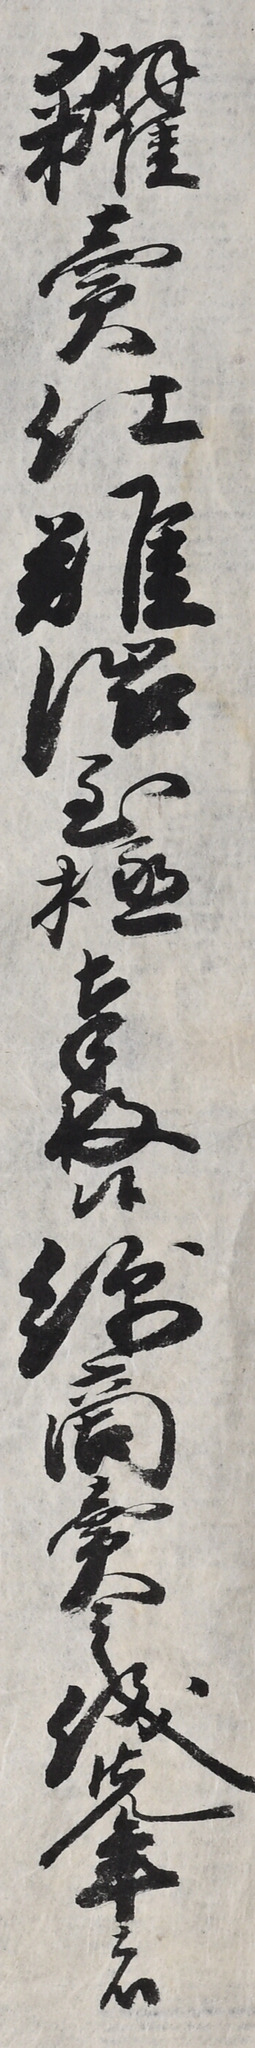糶売仕難渋至極奉存候綿商売之儀先年は
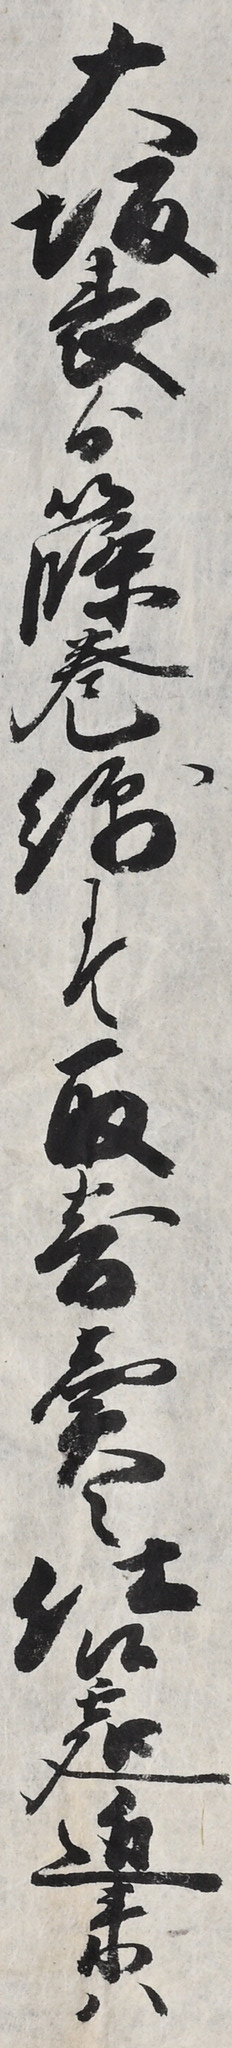大坂表ゟ篠巻綿にて取寄売ニ仕候処近来ハ
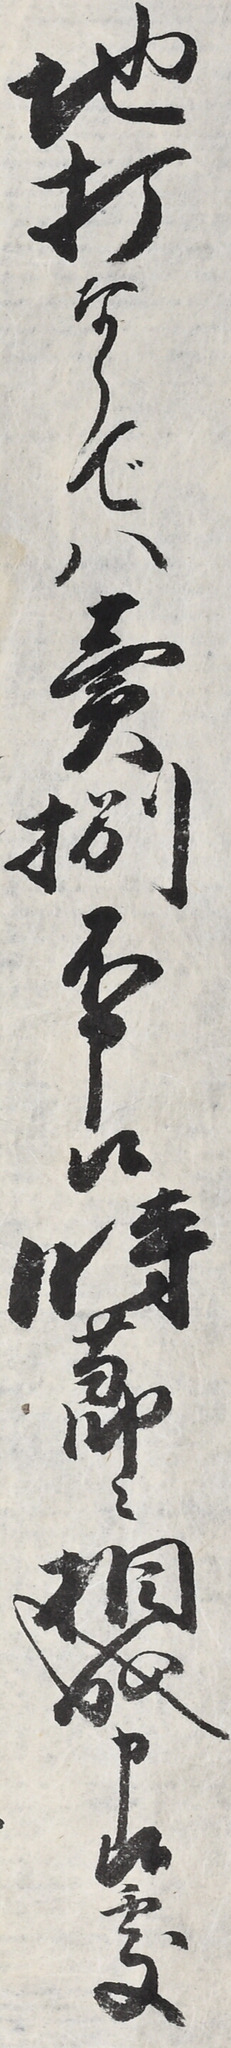他行ならでハ売捌不申候時節ニ相成申候処
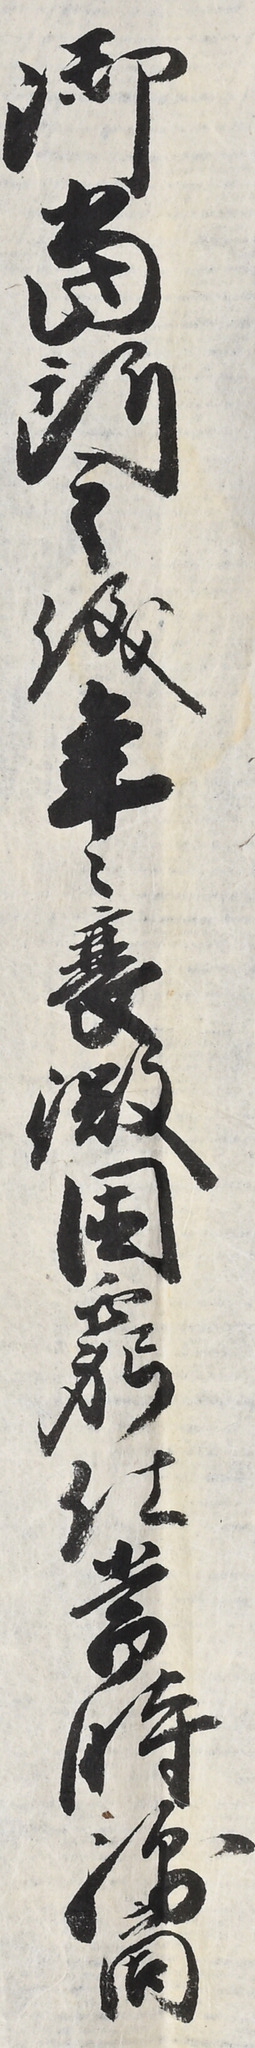御当所之儀年々衰微困窮仕当時綿商
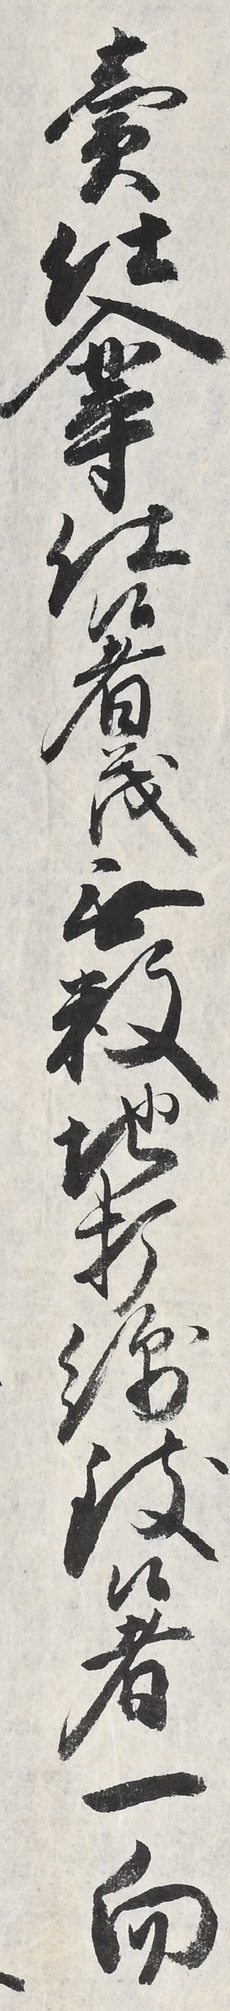売仕入等仕候者も無数地打綿致候者一向
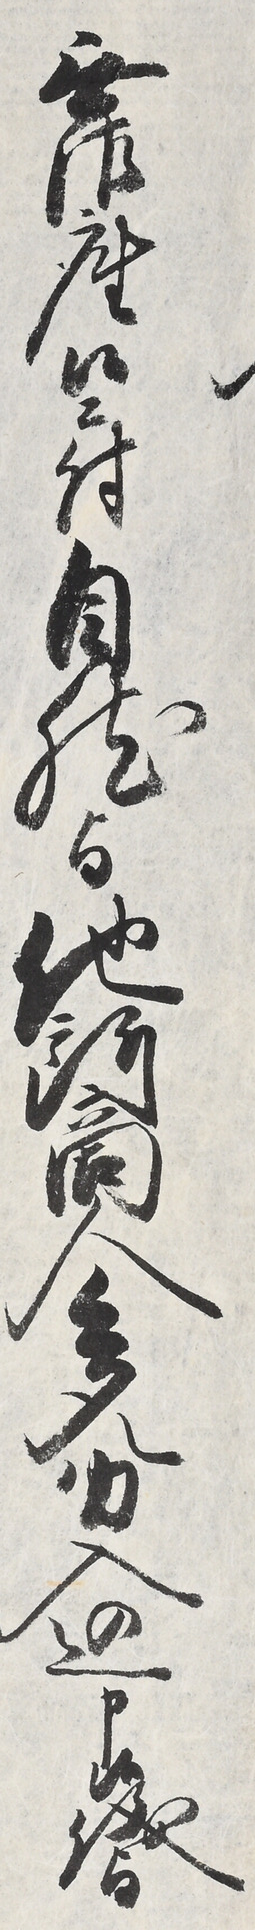無御座候ニ付自然と他所商人多分入込申候儀と
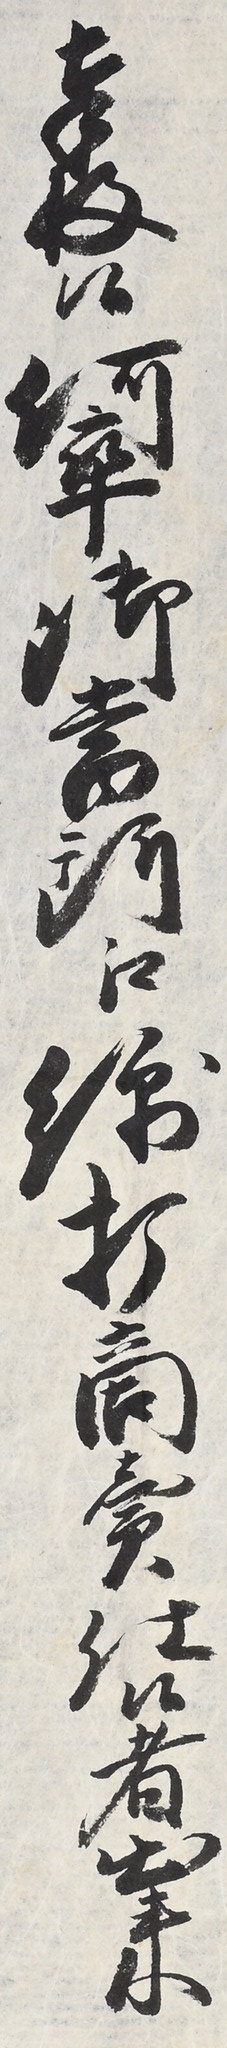奉存候何卒御当所江綿打商売仕候者出来
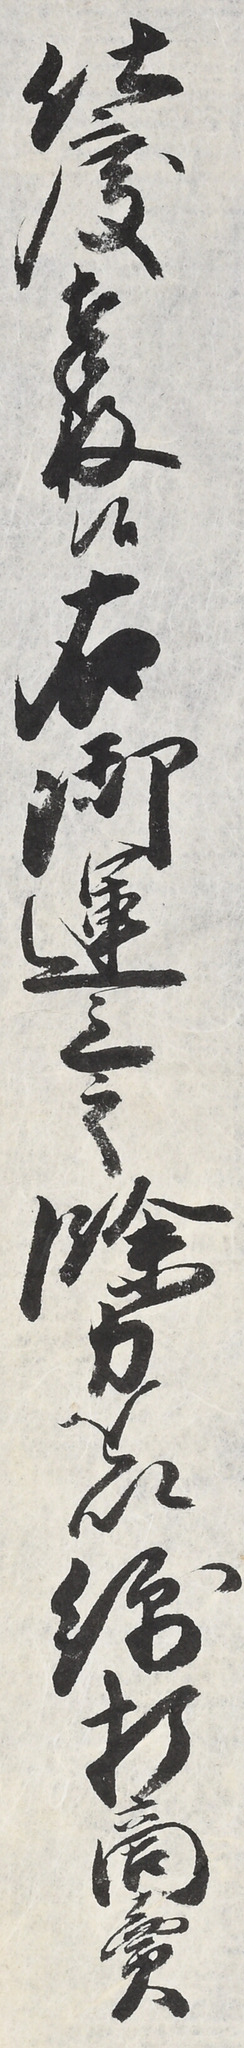仕度奉存候右御運上之余力を以綿打商売
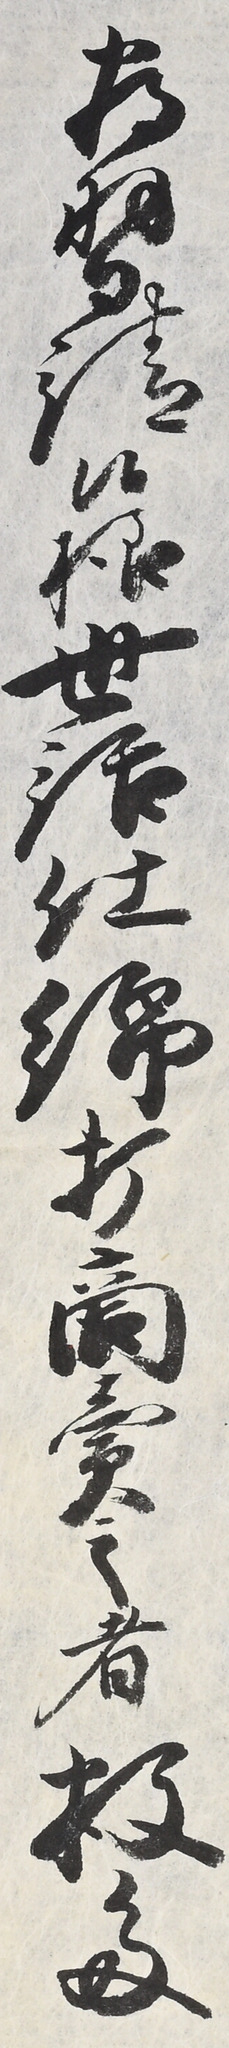為習請候様世話仕綿打商売之者数多
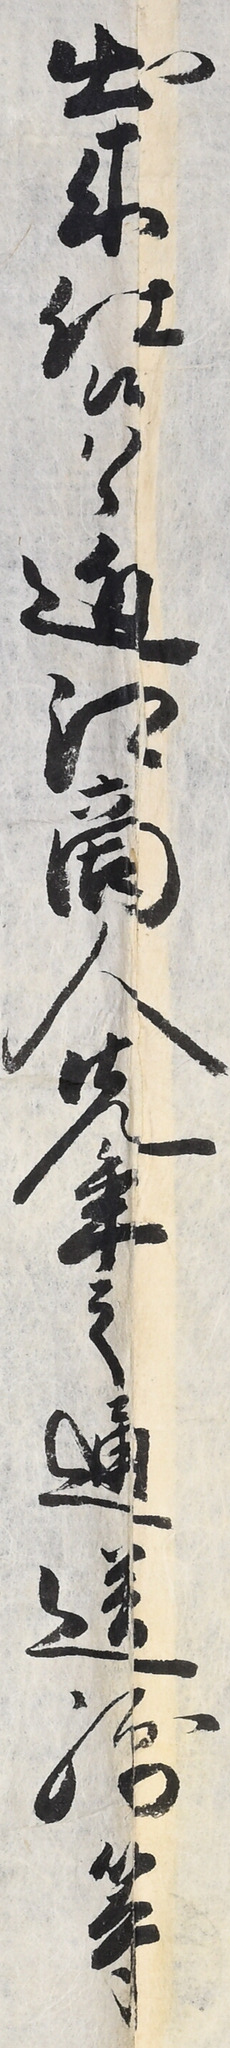出来仕候ハヽ近江商人先年之通送綿等
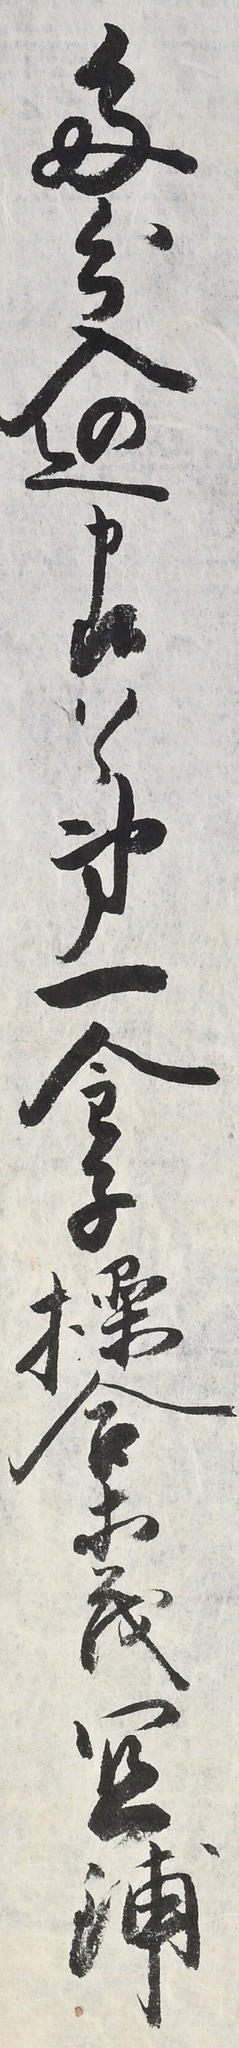多分入込申候ハヽ第一金子操合等も宜敷
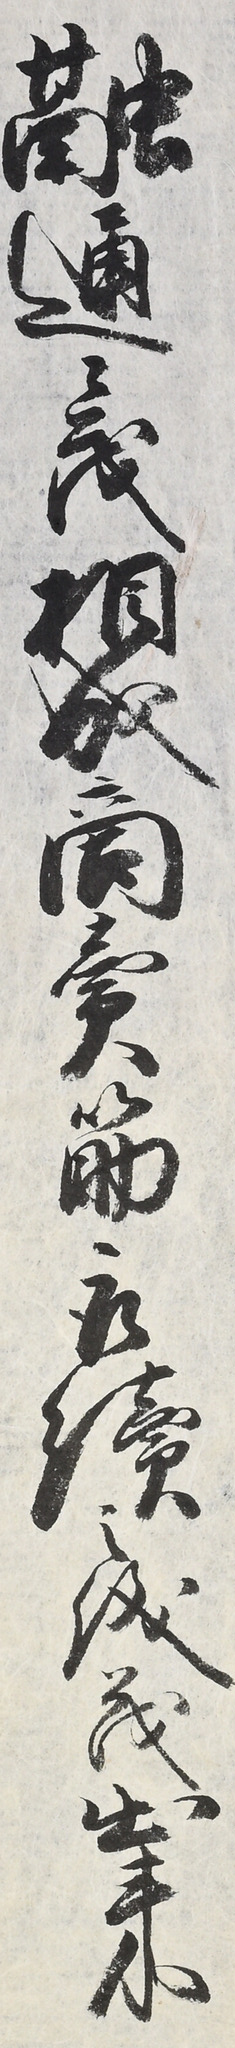融通ニも相成商売筋取続之儀も出来
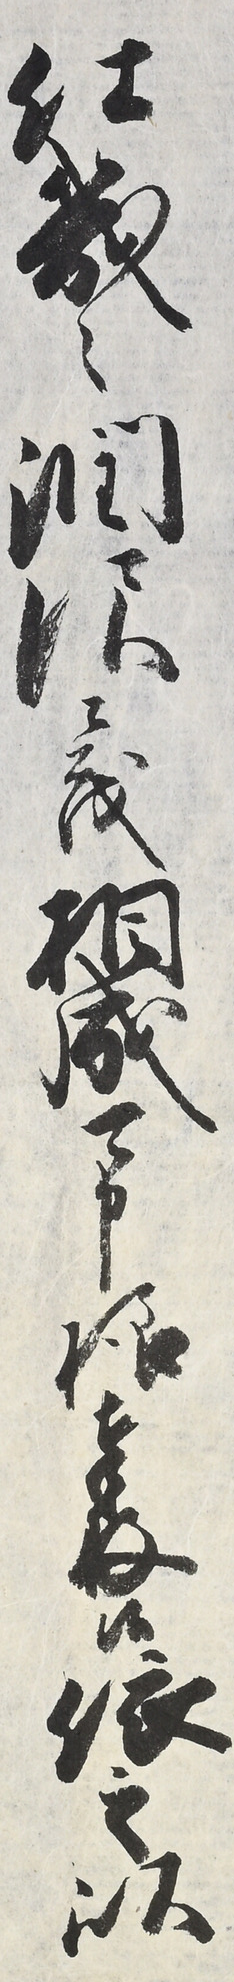仕幾々潤沢ニも相成可申様奉存候依之以
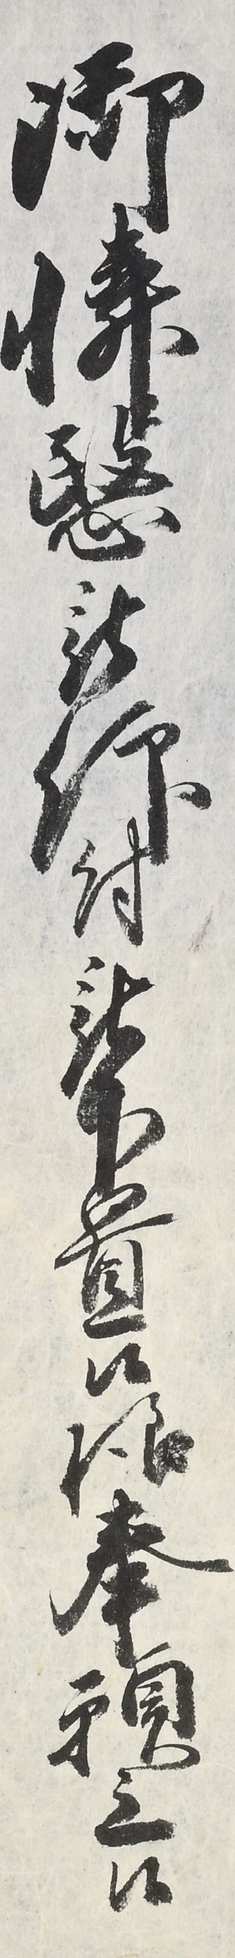御憐愍被仰付被下置候様奉願上候
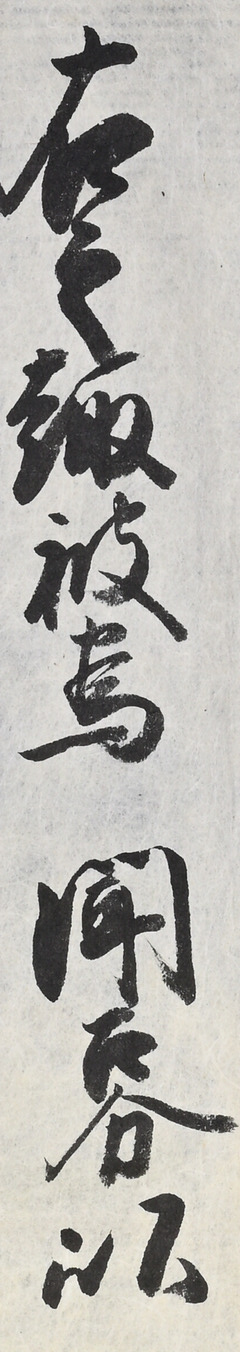右之趣被為聞召分以
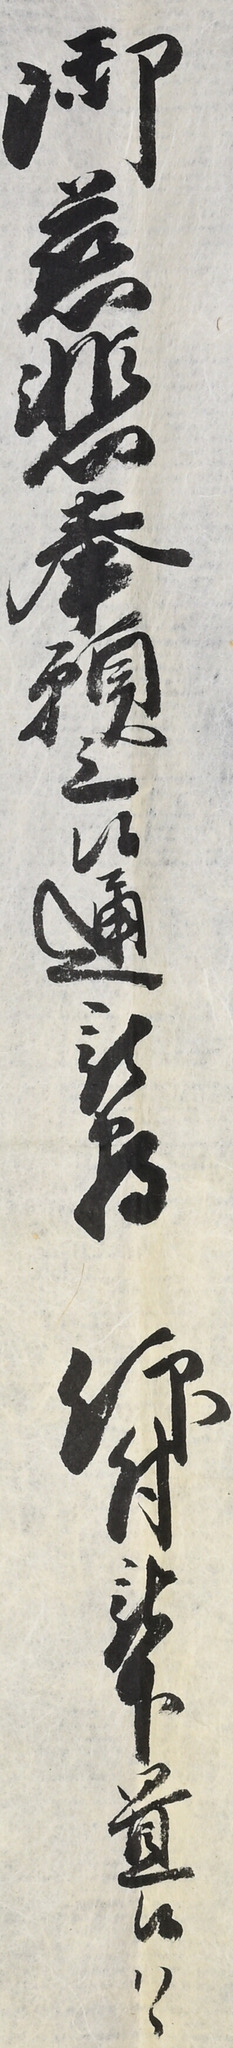御慈悲奉願上候通被為仰付被下置候ハヽ
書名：乍恐以口上書奉願上候御事
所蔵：伊那市立高遠町図書館・合同会社AMANE
